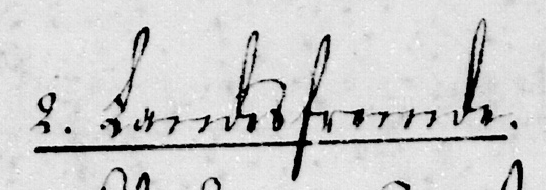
2. Landesfremde.
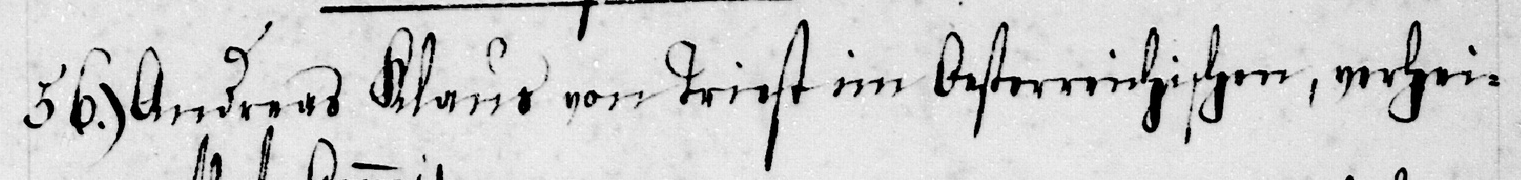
56.) Andreas Klaus von Triest im Oesterreichischen, verhei¬
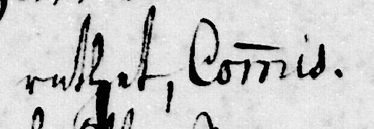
rathet, Commis.
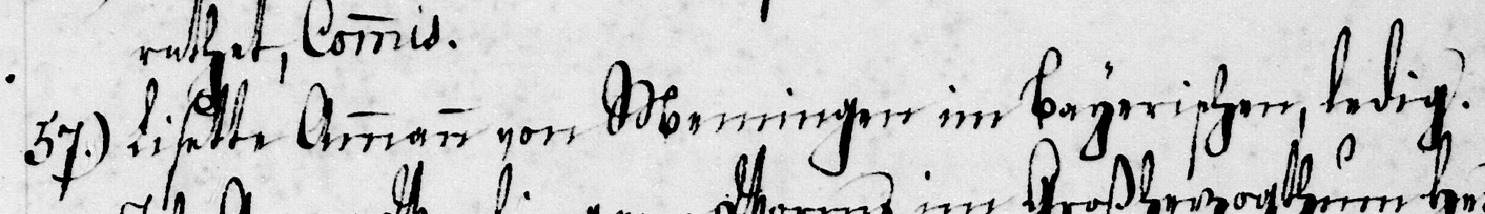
57.) Lisette Ammann von Memingen im Bayerischen, ledig.
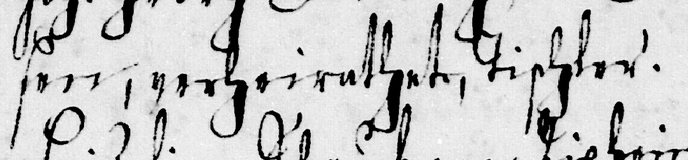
en, verheirathet, Tischler.
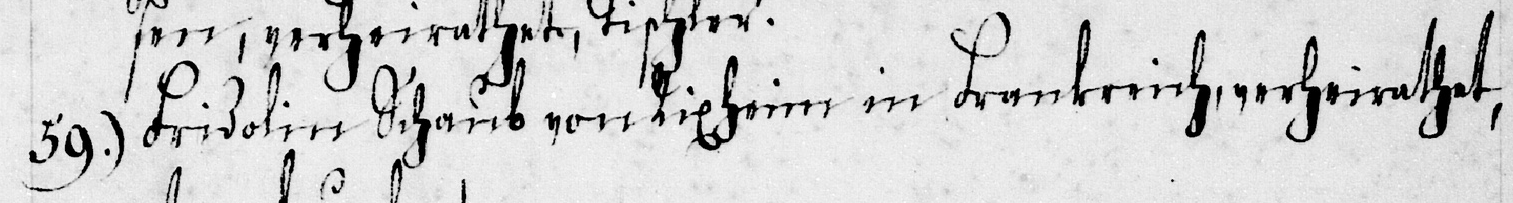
59.) Fridolin Schaub von Rixheim in Frankreich, verheirathet,
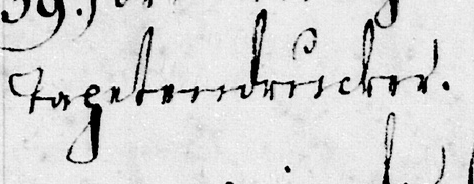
Tapetendrucker.
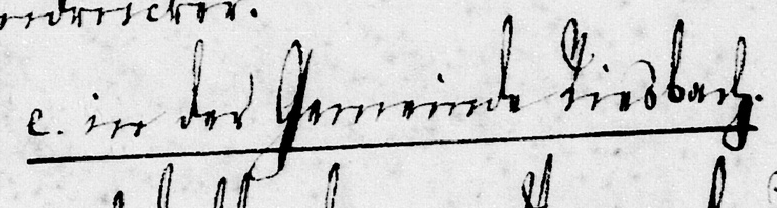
e. in der Gemeinde Riesbach.
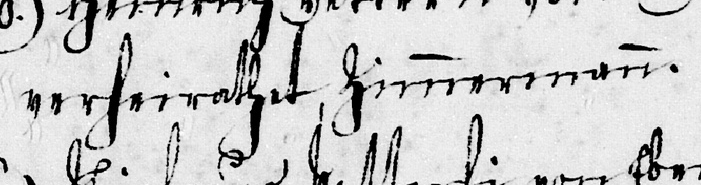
verheirathet, Zimmermann.
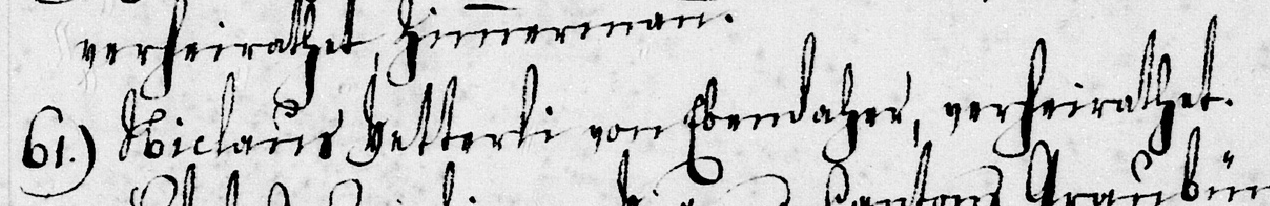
61.) Niclaus Vetterli von Ebendaher, verheirathet.
